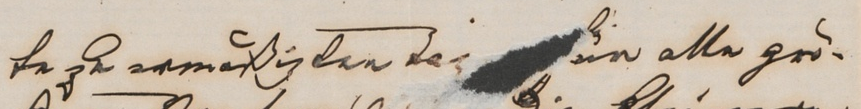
te zu ermäßigten Taxen für alle grö-
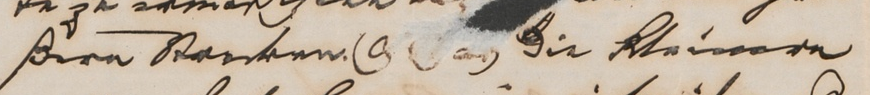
ßern Strecken & was die kleinern
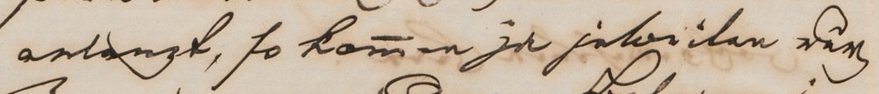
anlangt, so kommen ja jeweilen nur
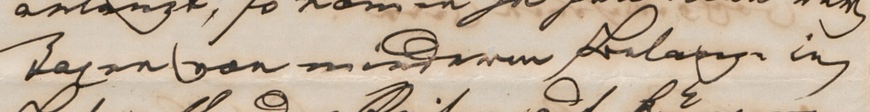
Taxen von niederm Belange in
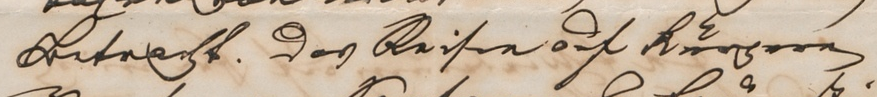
Betracht. Das Reisen auf kürzern
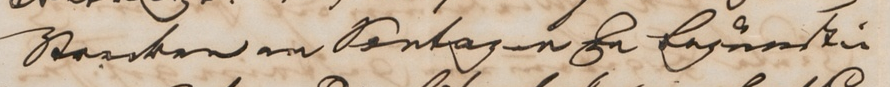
Strecken an Sontagen zu begünsti-
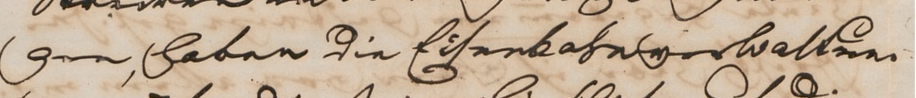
gen, haben die Eisenbahnverwaltun-
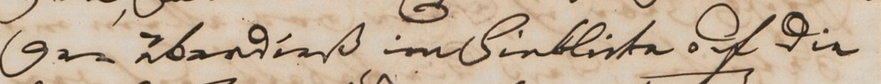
gen überdieß im Hinblicke auf die
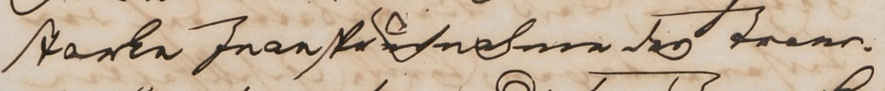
starke Inanspruchnahme des Trans-
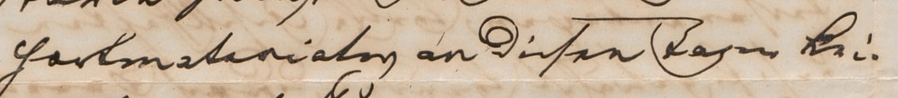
portmateriales an diesen Tagen kei-
